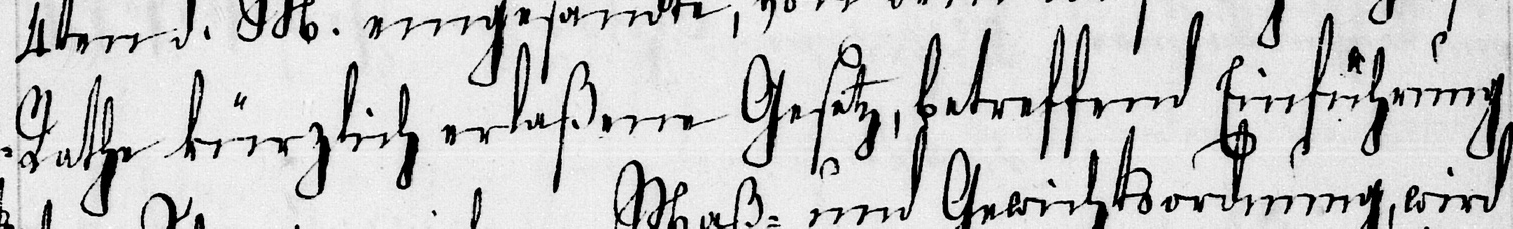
Rathe kürzlich erlaßene Gesetz, betreffend Einführung
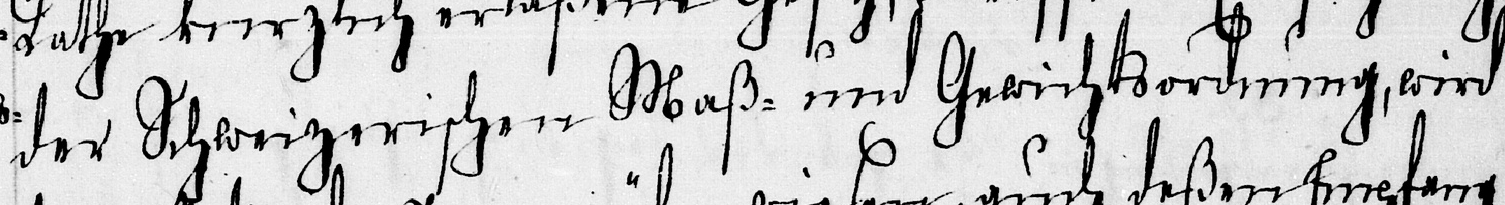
der Schweizerischen Maß- und Gewichtsordnung, wird
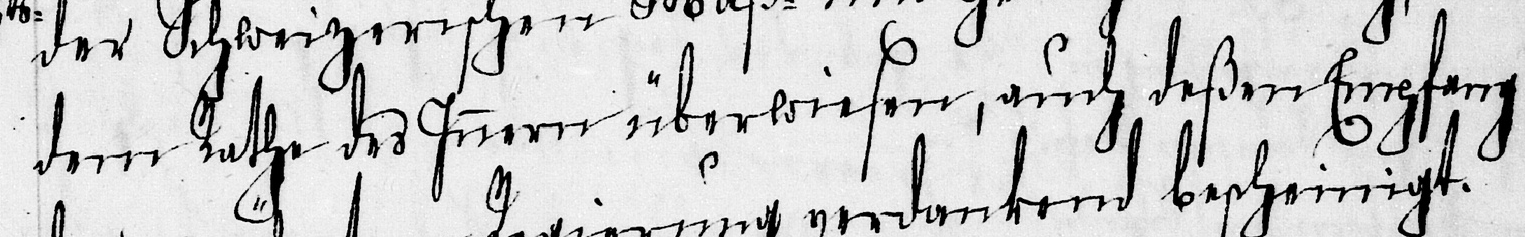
dem Rathe des Innern überwiesen, auch deßen Empfang
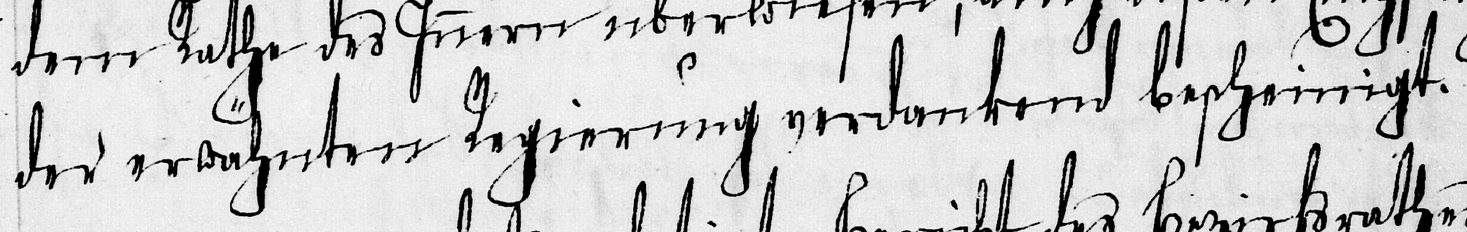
der erwähnten Regierung verdankend bescheinigt.
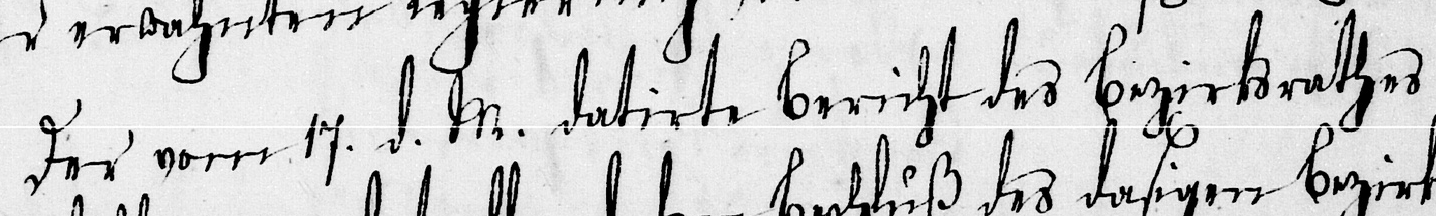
Der vom 17. d. M. datirte Bericht des Bezirksrathes
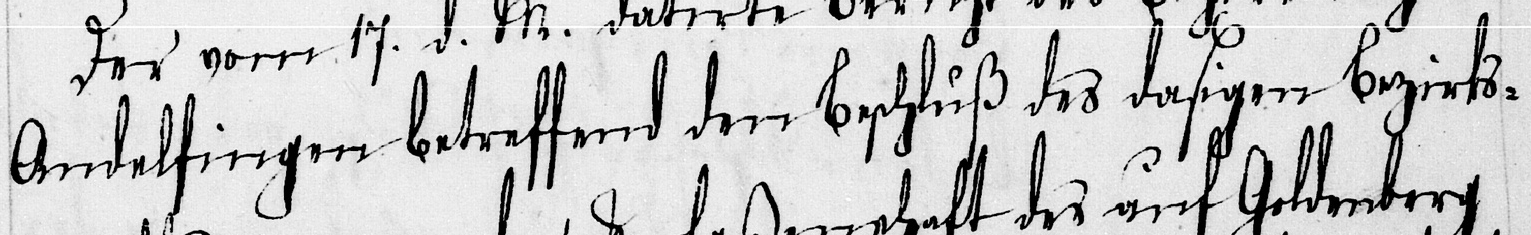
Andelfingen betreffend den Beschluß des dasigen Bezirks¬
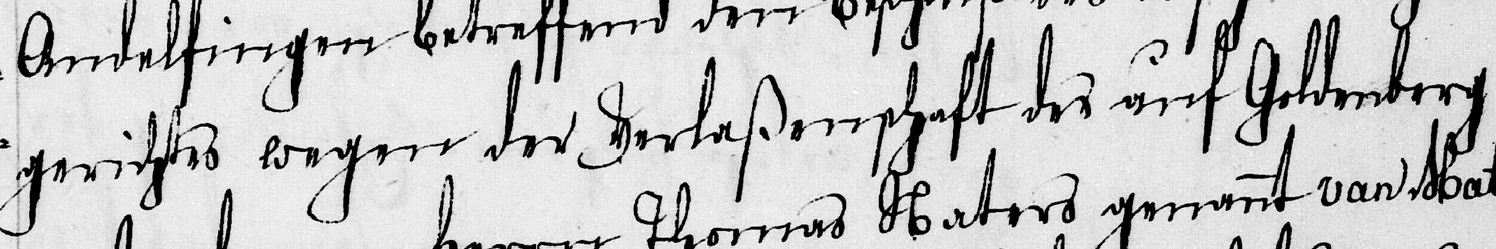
gerichtes wegen der Verlaßenschaft des auf Goldenberg
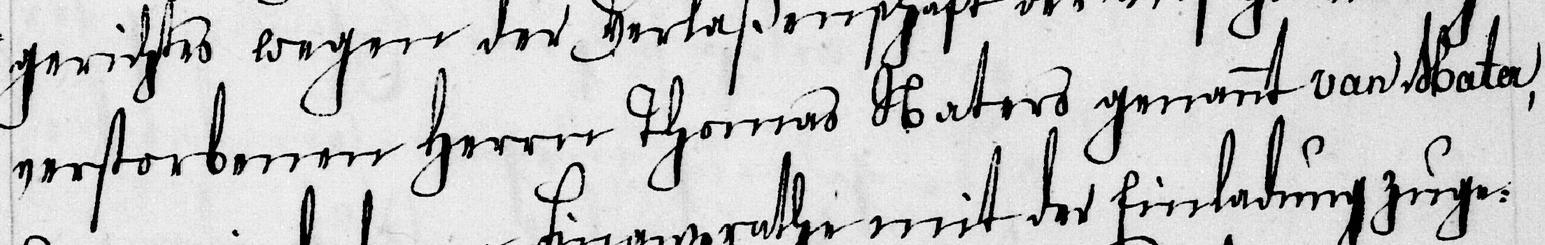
verstorbenen Herrn Thomas Naters genannt van Mater,
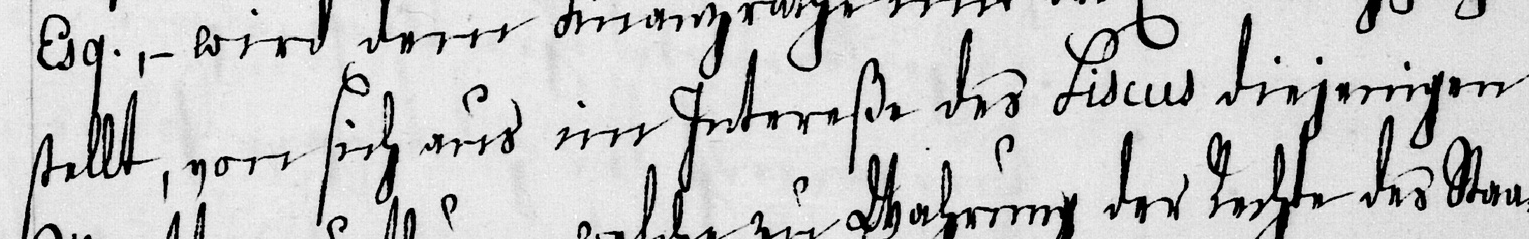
stellt, von sich aus im Intereße des Fiscus diejenigen
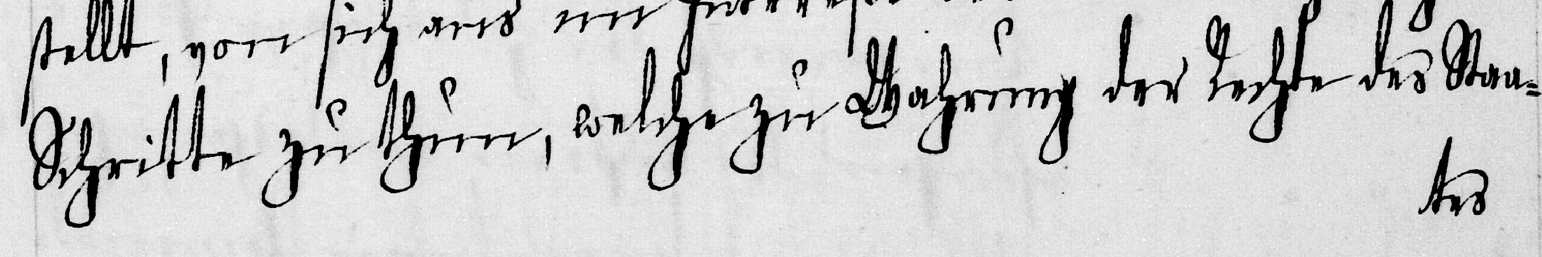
Schritte zu thun, welche zu Wahrung der Rechte des Sta¬
